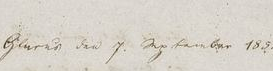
Glarus den 7. September 1852.
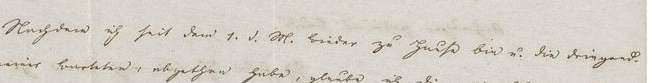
Nachdem ich seit dem 1. d. M. wieder zu Hause bin u. die dringend-
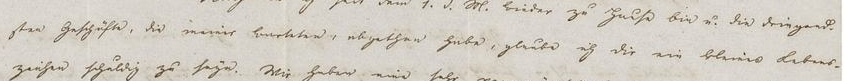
sten Geschäfte, die meiner warteten, abgethan habe, glaube ich Dir ein kleines Lebens-
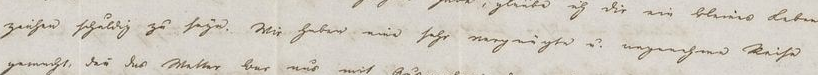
zeichen schuldig zu seyn. Wir haben eine sehr vergnügte u. angenehme Reise
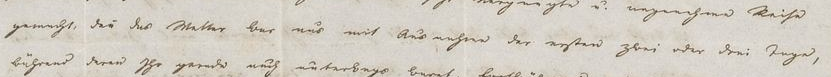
gemacht, denn das Wetter war uns mit Ausnahme der ersten zwei oder drei Tage,
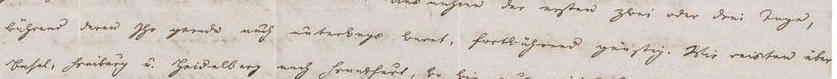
während deren Ihr gerade auch unterwegs waret, fortwährend günstig. Wir reisten über
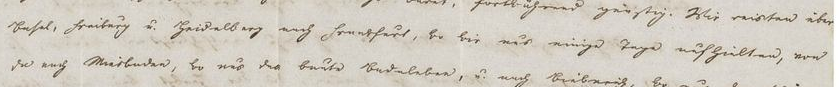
Basel, Freiburg u. Heidelberg nach Frankfurt, wo wir uns einige Tage aufhielten, von
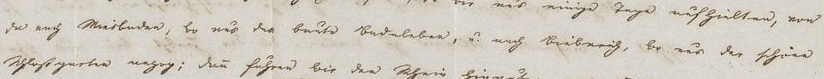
da nach Wiesbaden, wo uns das bunte Badeleben, u. nach Bieberich, wo uns der schöne
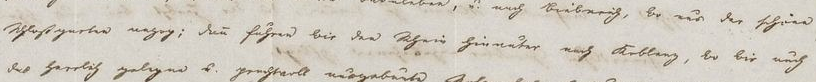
Schloßgarten anzog; dann fuhren wir den Rhein hinunter nach Koblenz, wo wir auch
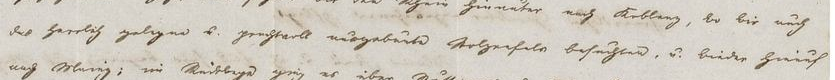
das herrlich gelegne u. prachtvoll ausgebaute Stolzenfels besuchten, u. wieder hinauf
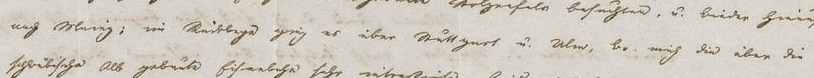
nach Mainz; im Rückwege ging es über Stuttgart u. Ulm, wo mich die über die
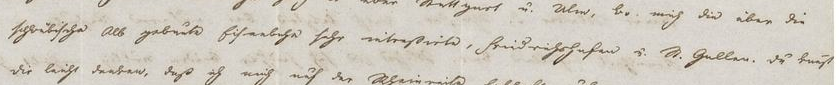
schwäbische Alb gebaute Eisenbahn sehr intressirte, Friedrichshafen u. St. Gallen. Du kannst
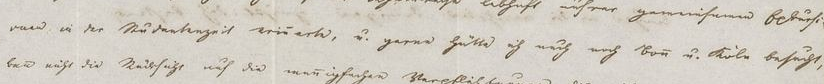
onen in der Studentenzeit erinnerte, u. gerne hätte ich auch noch Bonn u. Köln besucht,
